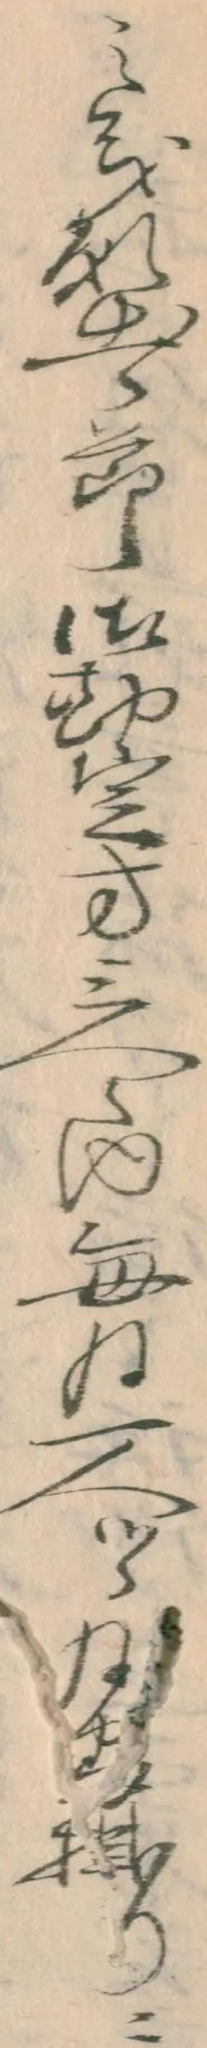之義願出候節御勘定方三人之内毎月一人ツヽ月番掛りニ
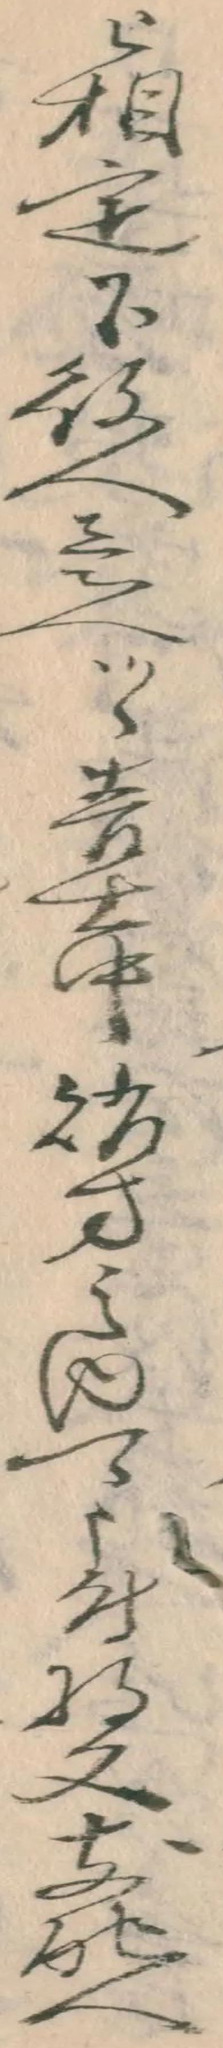被相定下役人壱人ツヽ青士中賄方之内可申付将又支配人
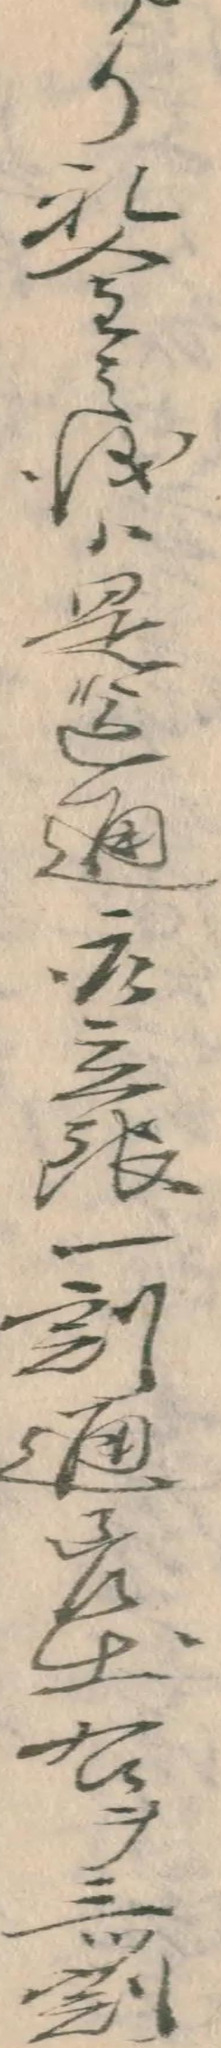より礼金之儀ハ是迄通取立銀一割通差出右ヲ三ツ割
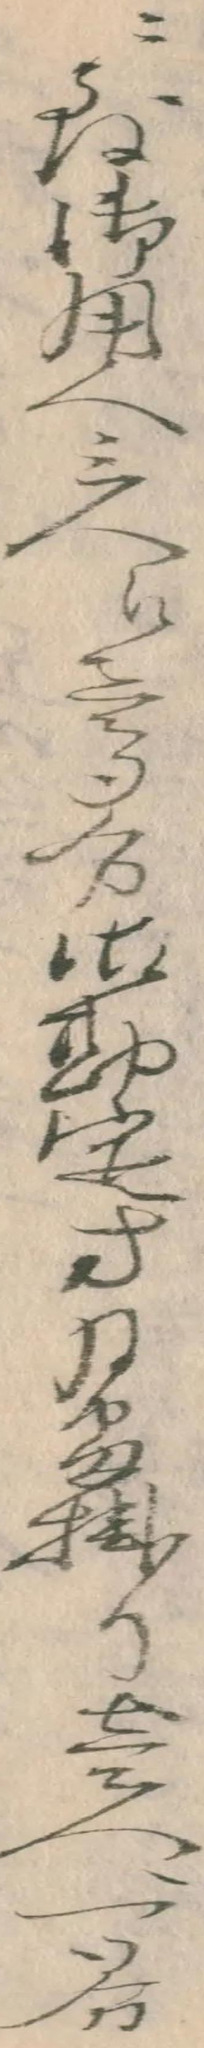ニ不致御用人三人え壱ツ分御勘定方月番掛り壱人に一ツ分
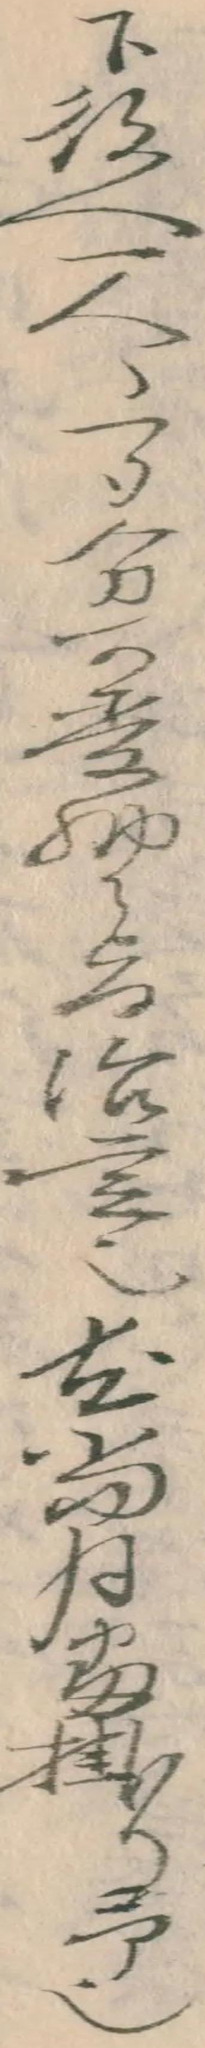下役人一人ヘ一ツ分可受納候旨治定也尤當月番掛り予也
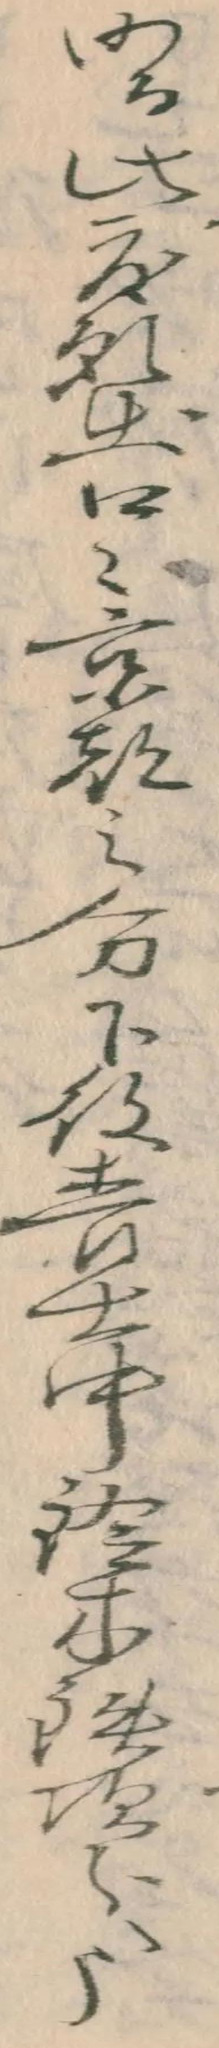仍而此度願出口々京都之分下役青士中鈴木鉄次郎へ申
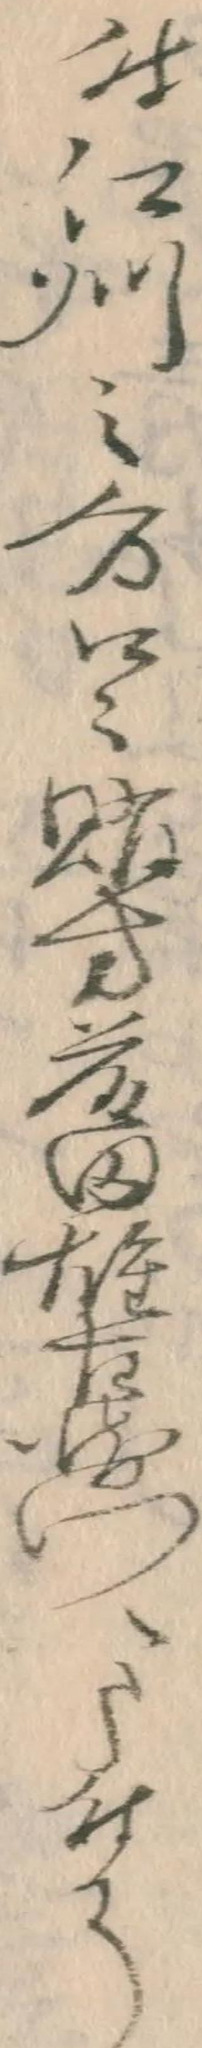付江州之分口々賄方藤田雄左衛門へ申付了
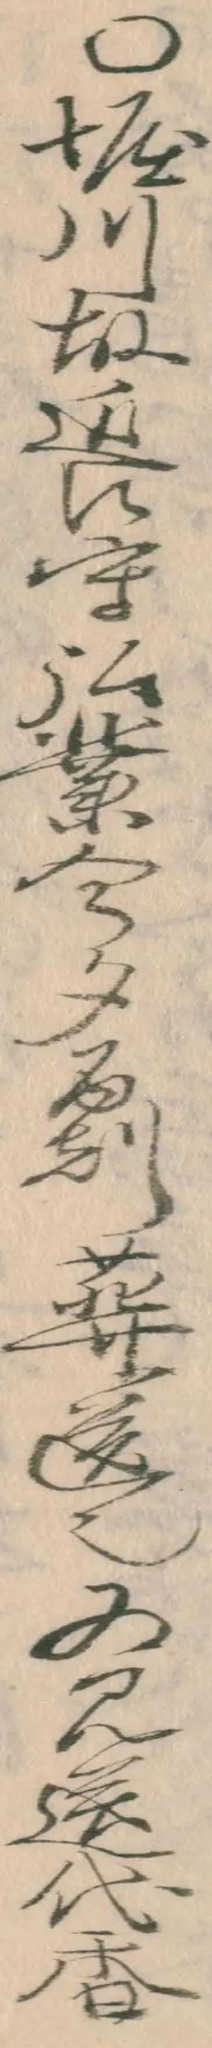○堀川故近江守弘業今夕酉刻葬送也為見送代香
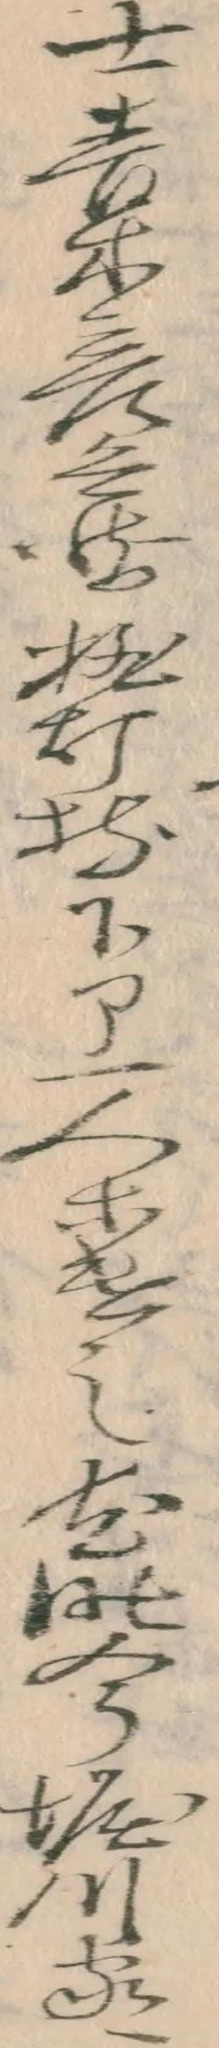士青木彦兵衛挑灯持下部一人等遣之尤昨今堀川家へ
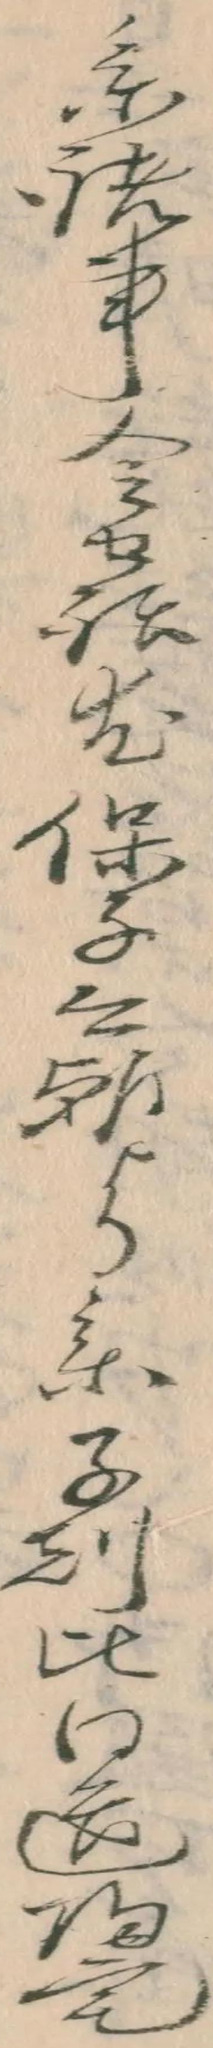参諸事令世話尤保子今朝より参子刻比同道帰宅
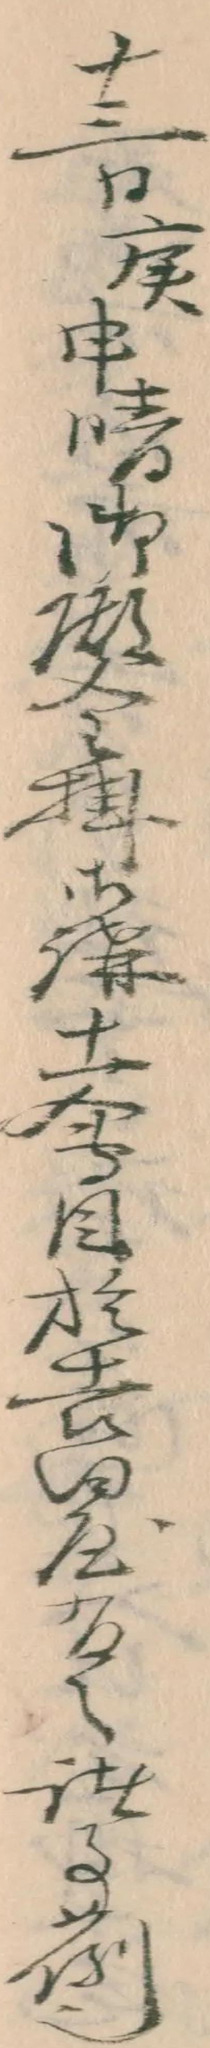十三日庚申晴御殿金掛御講十一會目於吉田屋有之諸事如例也
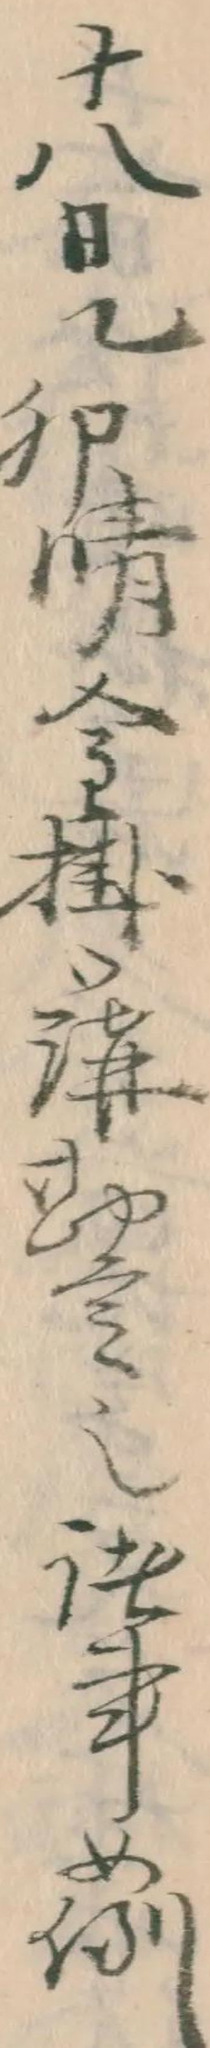十八日乙卯晴金掛御講勘定之諸事如例
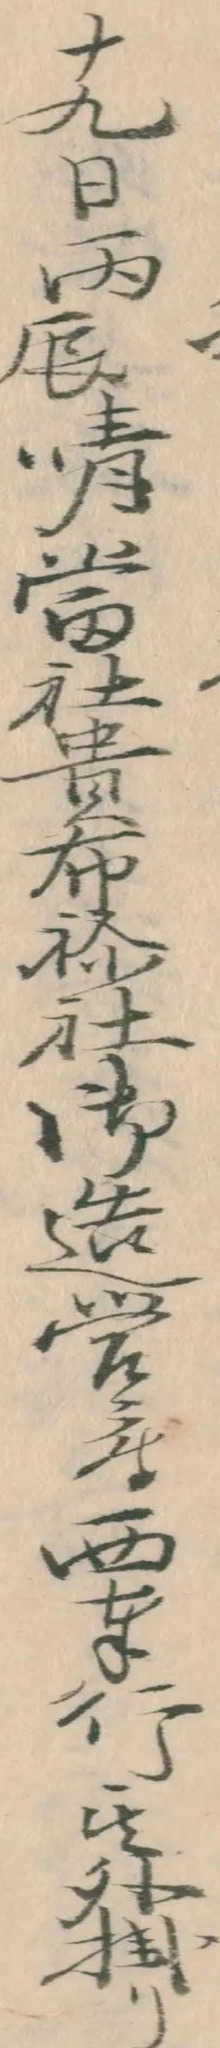十九日丙辰晴當社貴布祢社御造営ニ付西奉行其外掛り
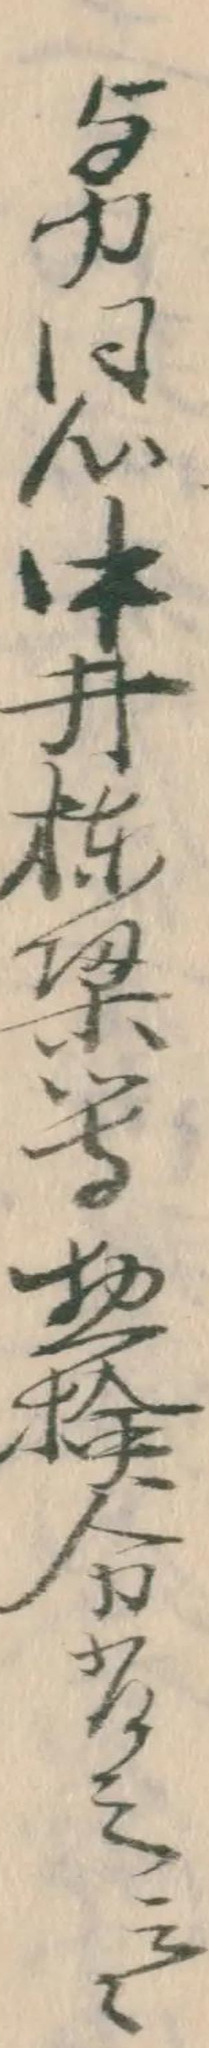与力同心中井棟梁等惣検分有之云々
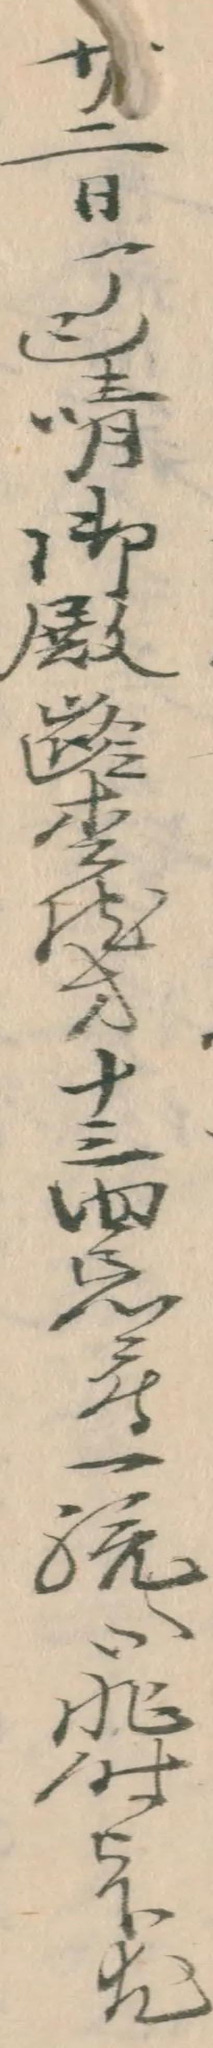廿二日丁巳晴御殿齢杢然方十三回忌ニ付一統へ御非時被下尤
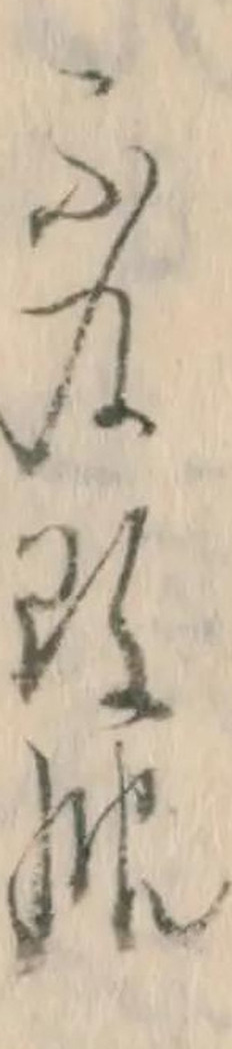不及改服
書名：賀茂社記録. 第66冊
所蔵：国立国会図書館 National Diet Library, JAPAN
